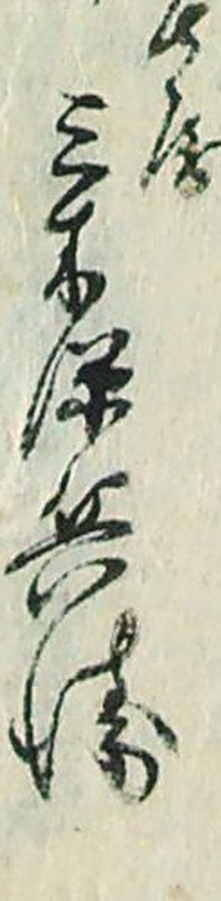三木源兵衛
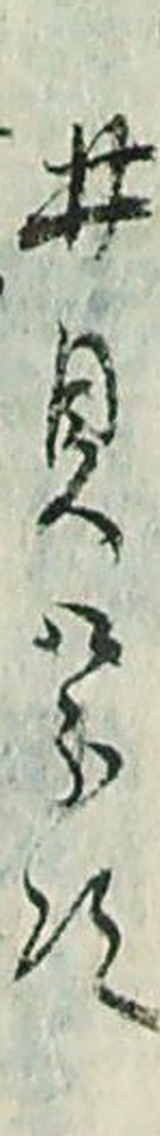井貝八郎次
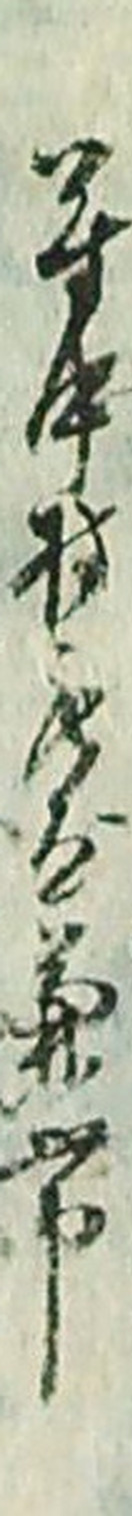府中村庄屋兼帯
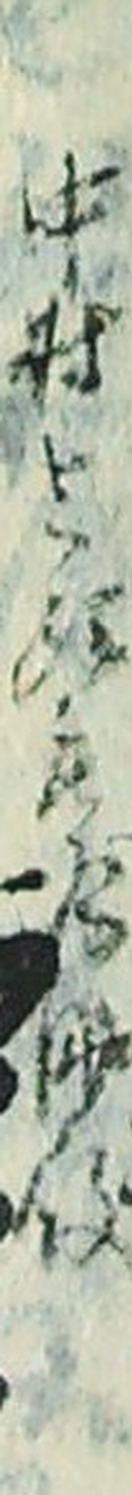中村与頭庄屋助役
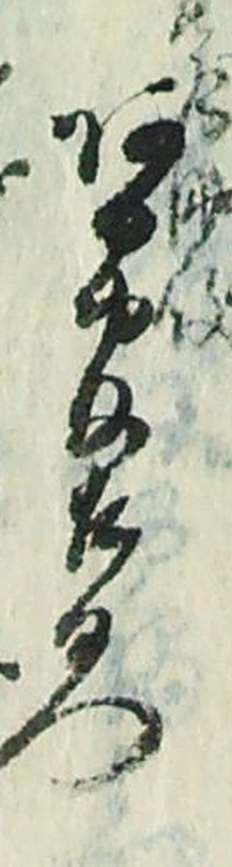阿部官左衛門
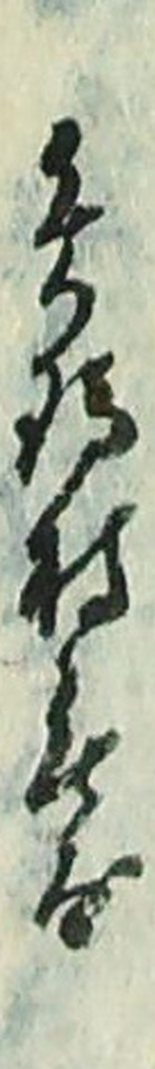矢野村庄屋
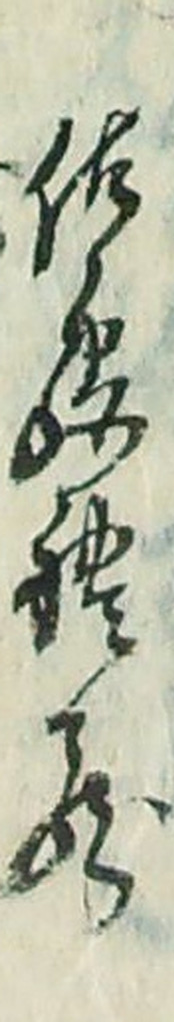佐藤礼蔵
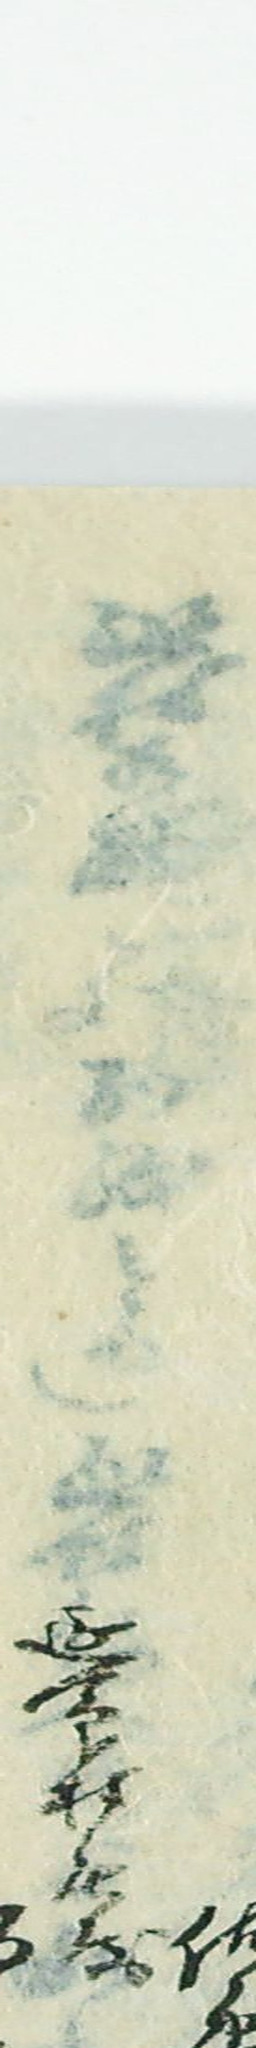矢野村庄屋
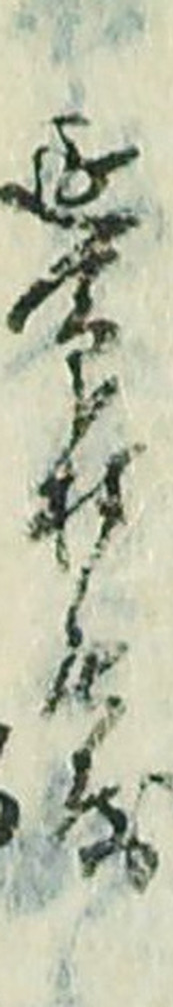延命村庄屋
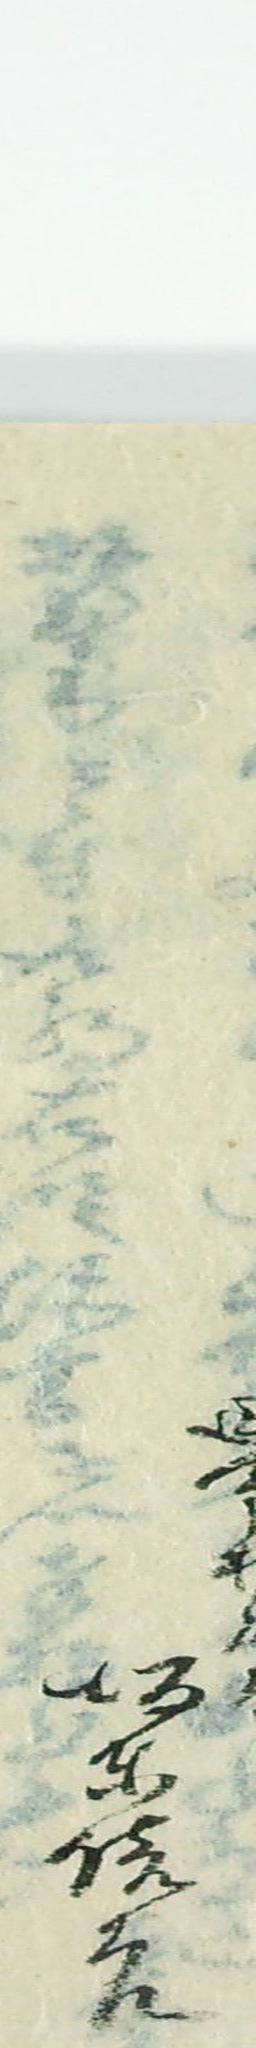坂東信吉
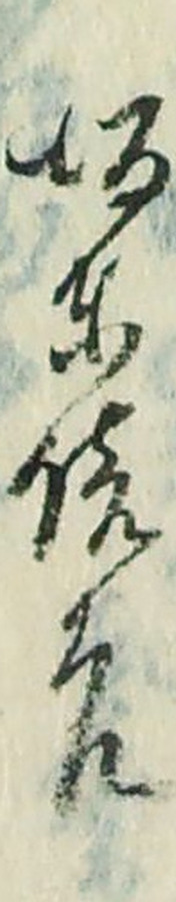坂東信吉
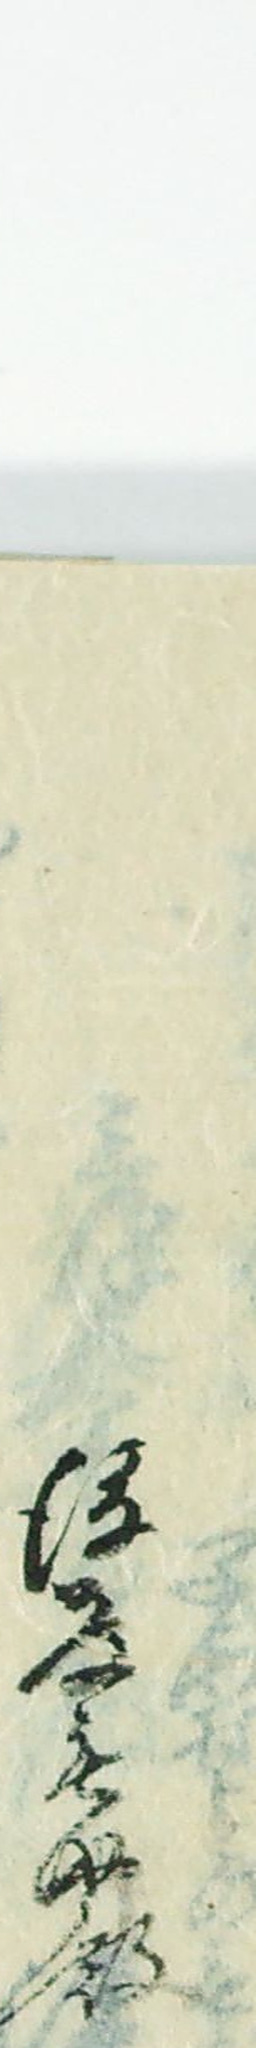後藤庄助殿
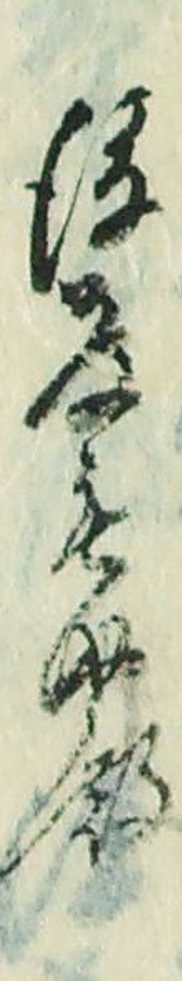後藤庄助殿
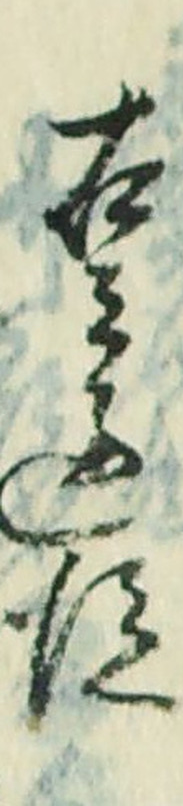右之通従
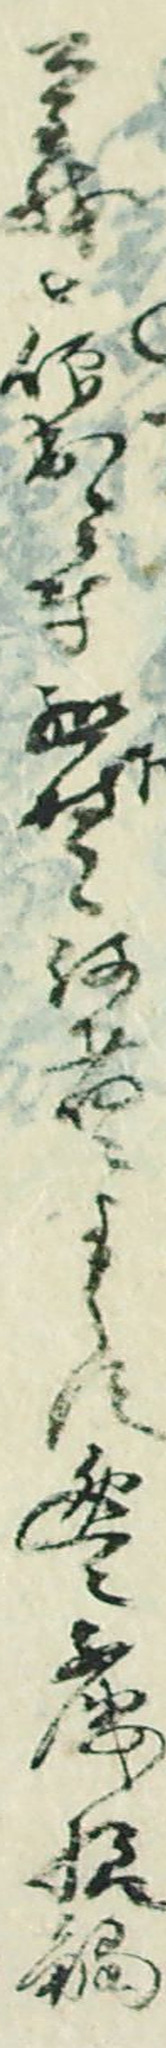公義被仰出候に付組下村々何者によらす逸々不洩様触
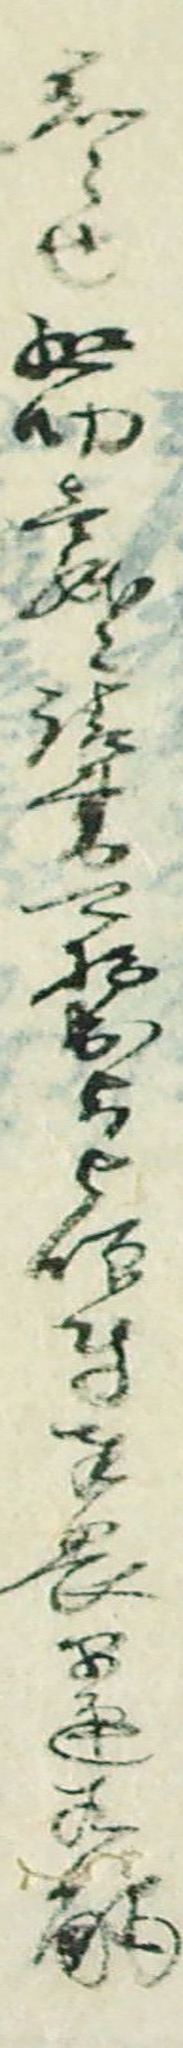知らせ組切壱紙に受書可指出旨被仰付奉畏早速相触
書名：諸御用御□受書控
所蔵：鳴門教育大学 Naruto University of Education
